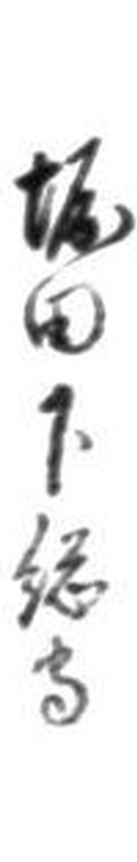堀田下総守
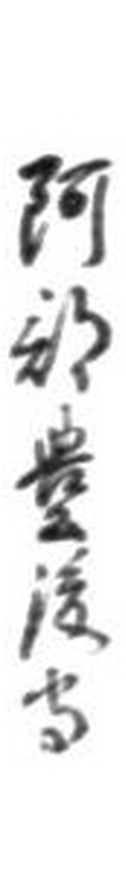阿部豊後守
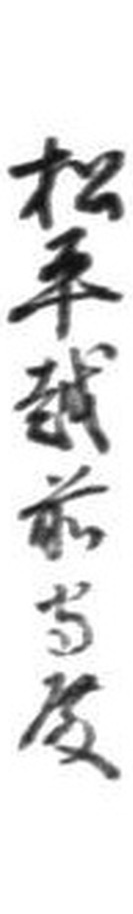松平越前守殿

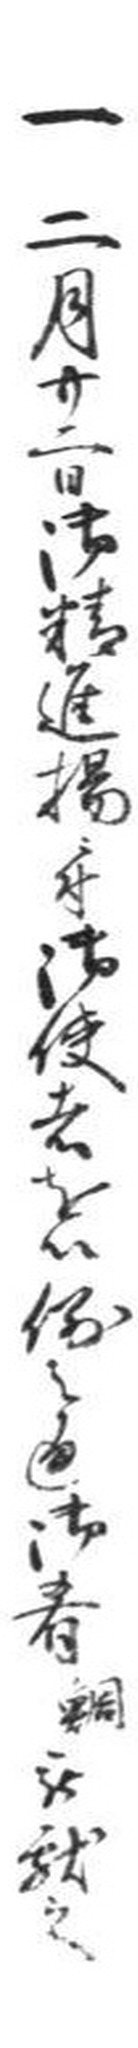一二月廿二日御精進揚ニ付御使者を以例之通御肴鯛被献之
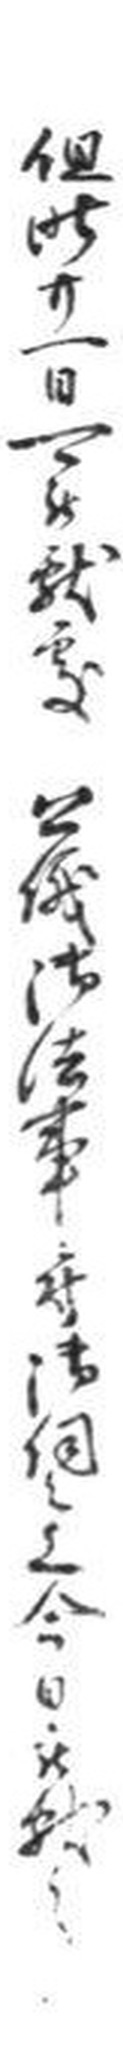但昨廿一日可被献処公儀御法事ニ付御伺之上今日被献之
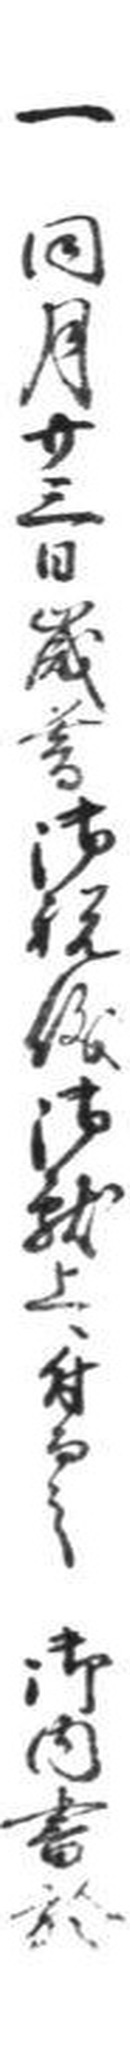一同月廿三日歳暮御祝儀御献上ニ付而之御内書於
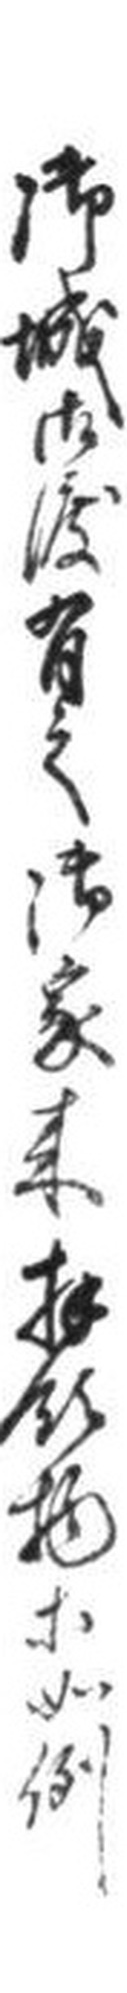御城御渡有之御家来拝領物等如例
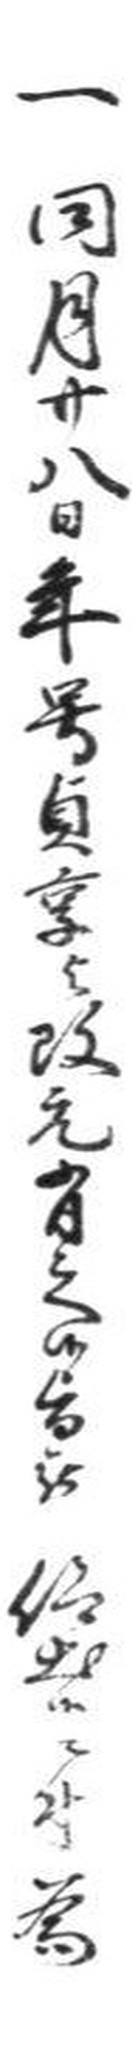一同月廿八日年号貞享と改元有之候旨被仰出候ニ付為
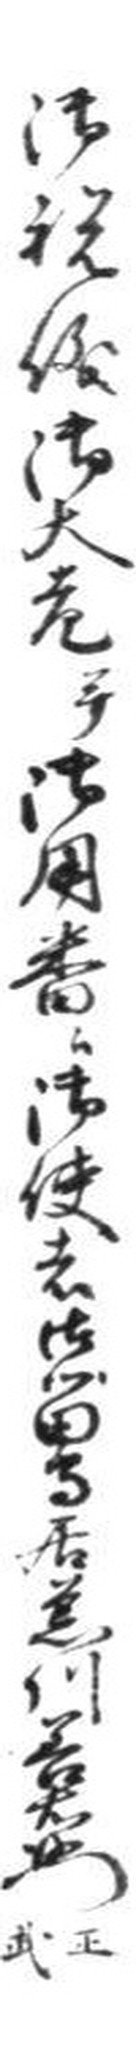御祝儀御大老并御用番江御使者御留守居荒川善右衛門正武
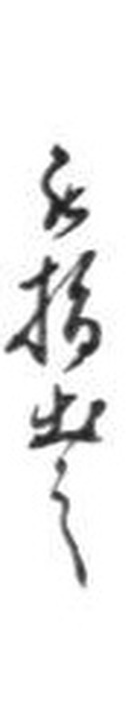被指出之
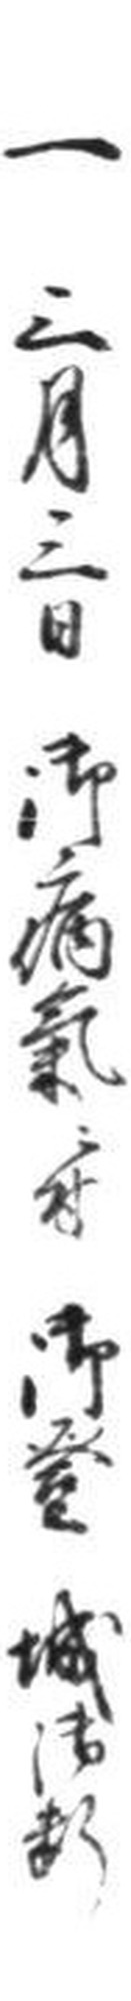一三月三日御病気ニ付御登城御断
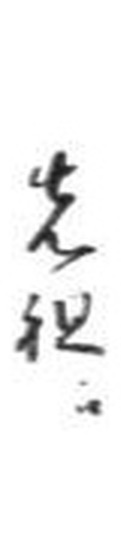先祖江
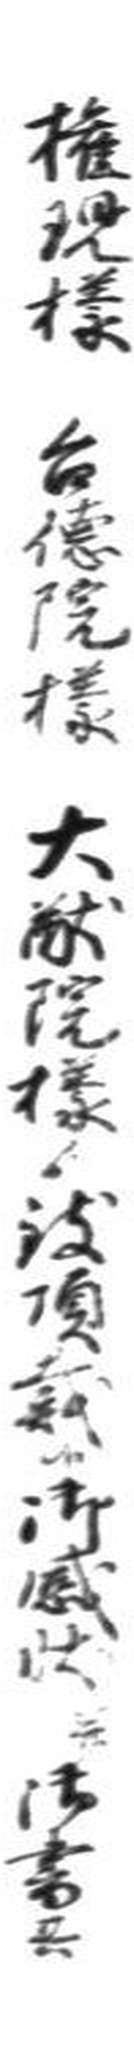権現様台徳院様大猷院様ゟ致頂戴候御感状并御書其
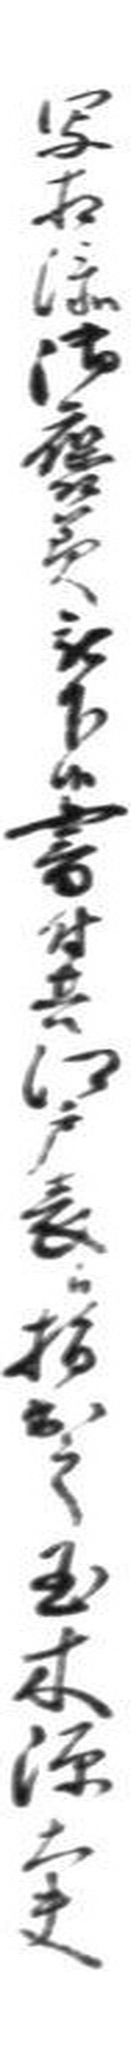写相添御褒美被下候書付共江戸表江指出之玉木源太夫
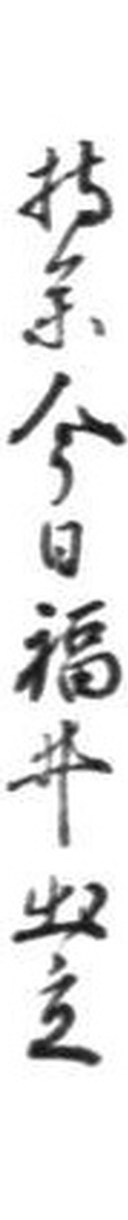持参今日福井出立
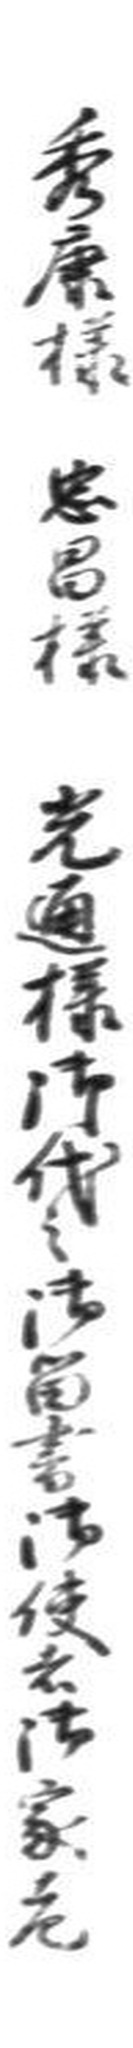秀康様忠昌様光通様御代之御留書御使者御家老
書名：家譜 十五 綱昌公 従天和元年到元禄十二年
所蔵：福井県文書館 Fukui Prefectural Archives
